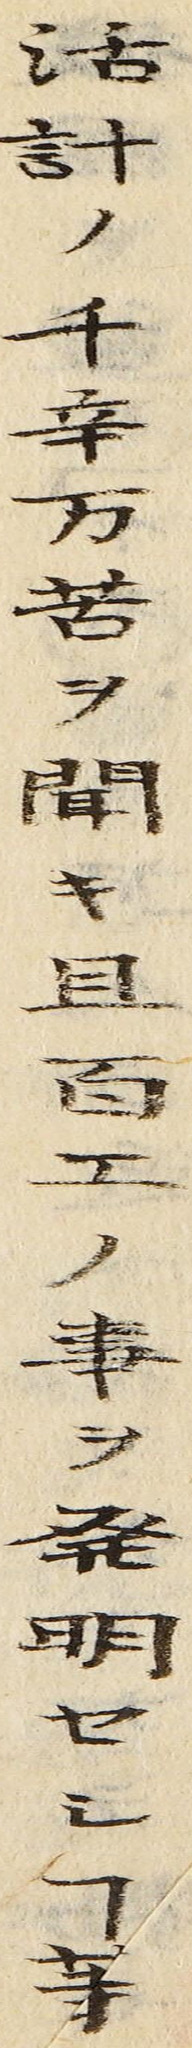活計ノ千辛万苦ヲ聞キ且百工ノ事ヲ発明セシコト等
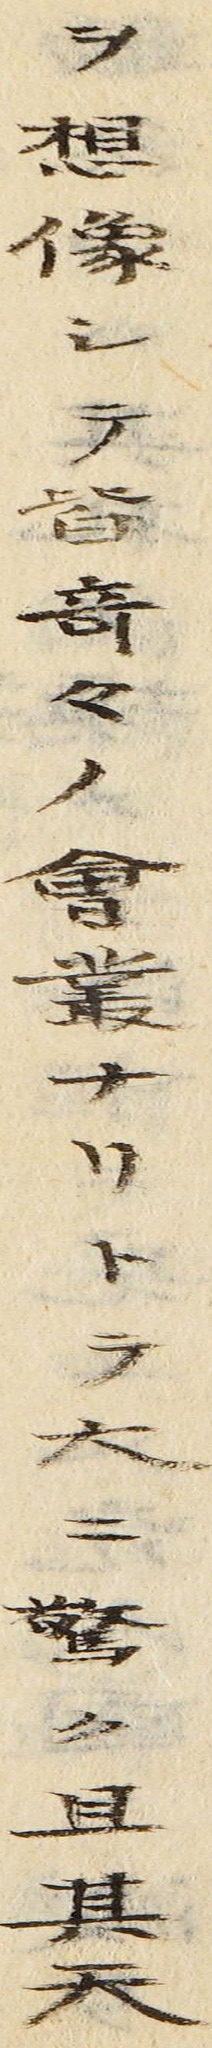ヲ想像シテ皆竒々ノ会叢ナリトテ大ニ驚ク且其天
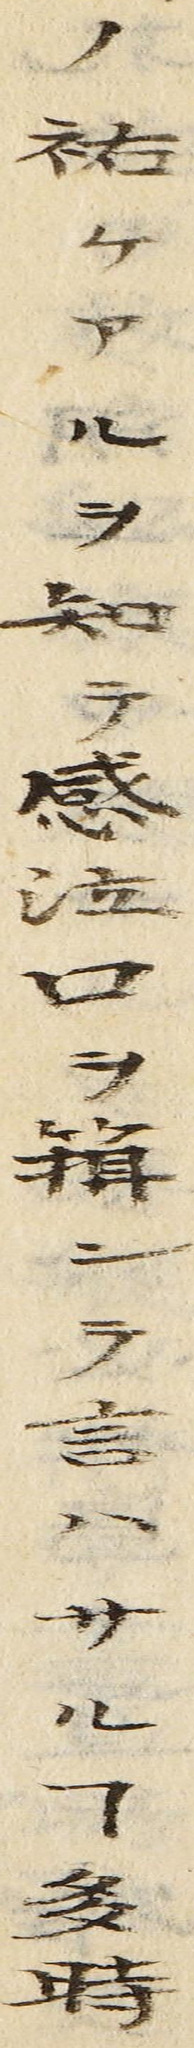ノ祐ケアルヲ知テ感泣口ヲ䈤ンテ言ハサルコト多時
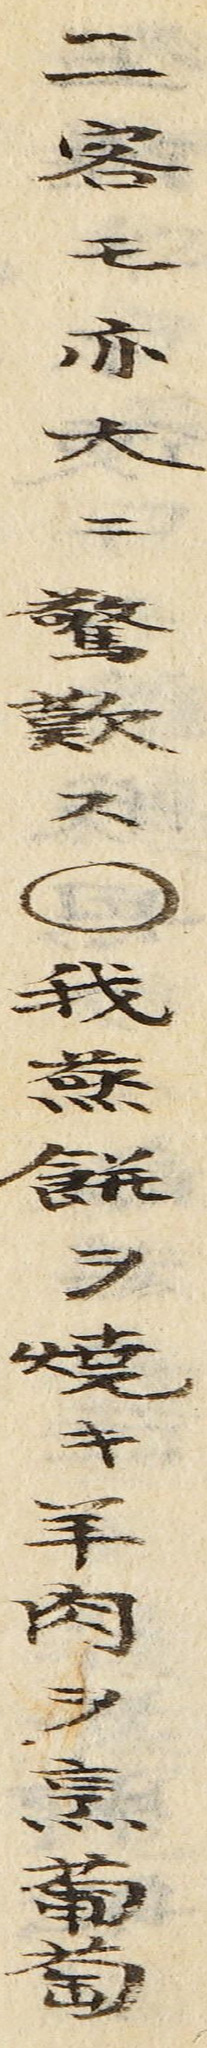二客モ亦大ニ驚歎ス◯我蒸餅ヲ焼キ羊肉ヲ烹葡萄
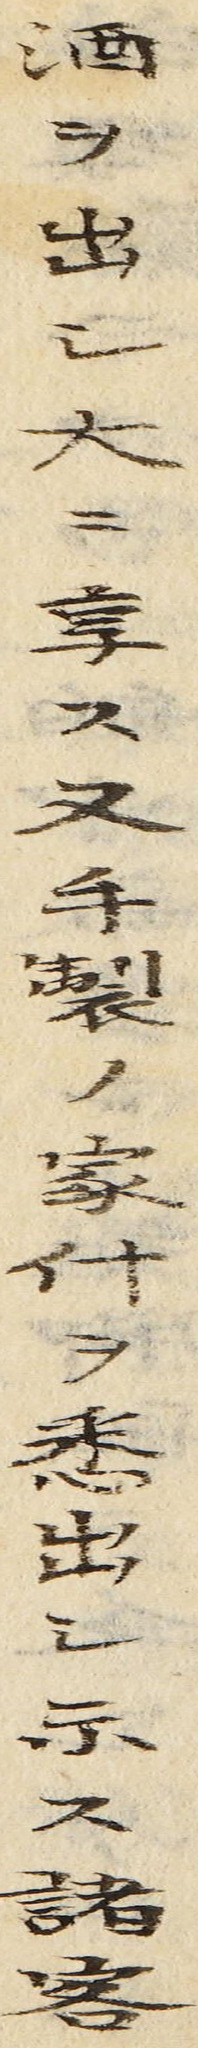酒ヲ出シ大ニ享ス又手製ノ家什ヲ悉出シ示ス諸客
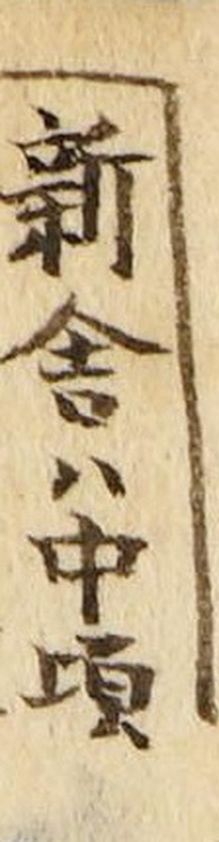新舎ハ中頃
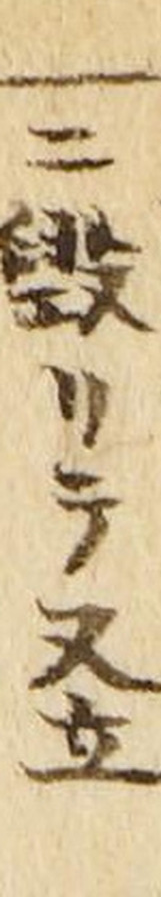ニ毀リテ又立
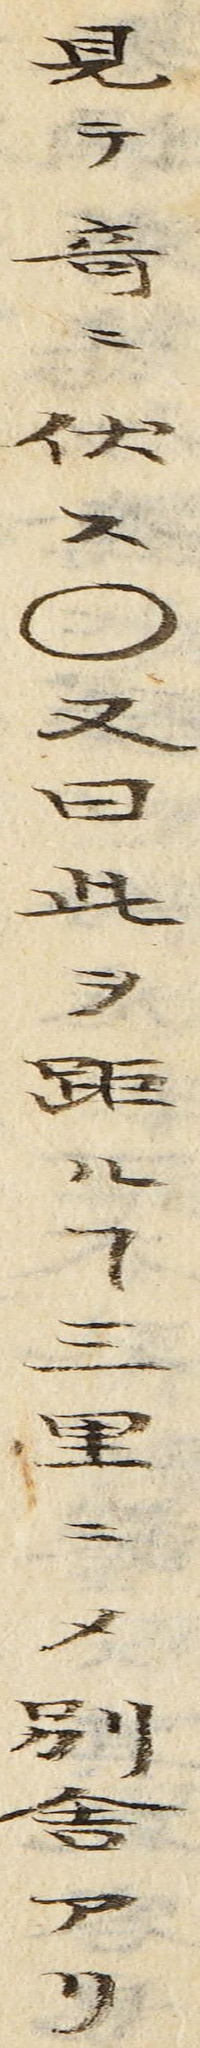見テ奇ニ伏ス◯又曰此ヲ距ルコト三里ニシテ別舎アリ
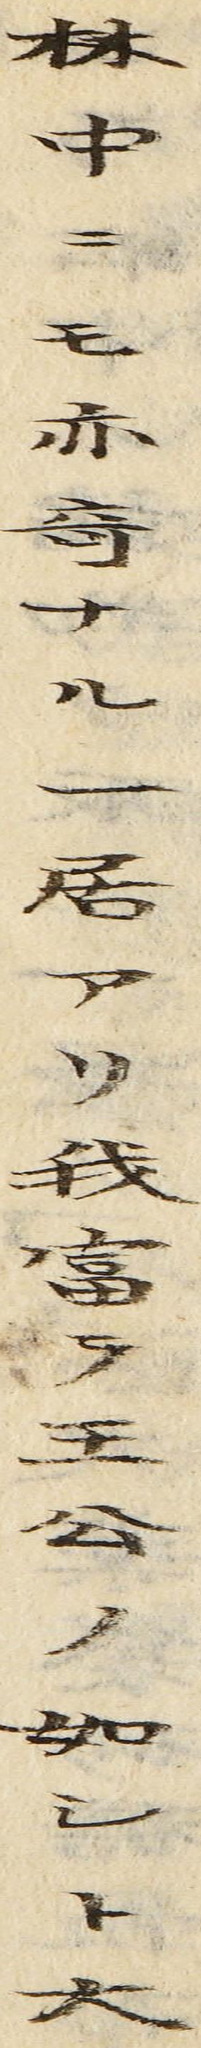林中ニモ亦奇ナル一居アリ我富テ王公ノ如シト大
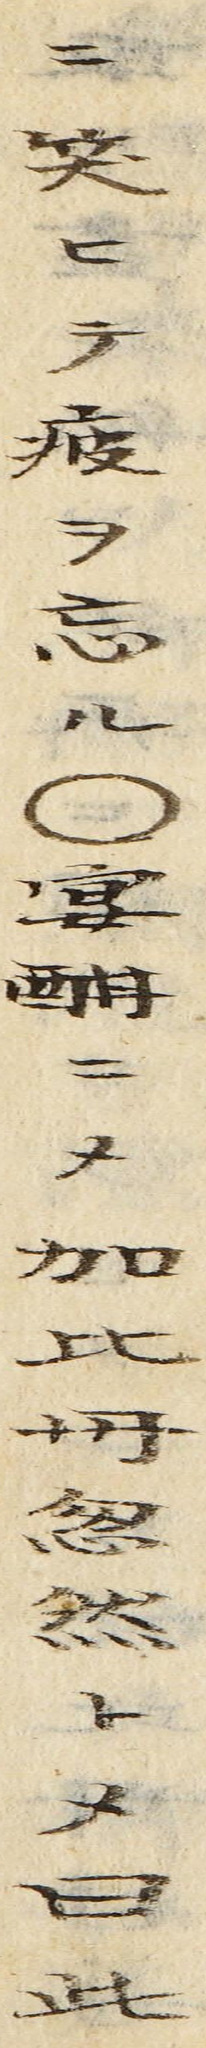ニ笑ヒテ疲ヲ忘ル◯宴酣ニシテ加比丹忽然トシテ曰此
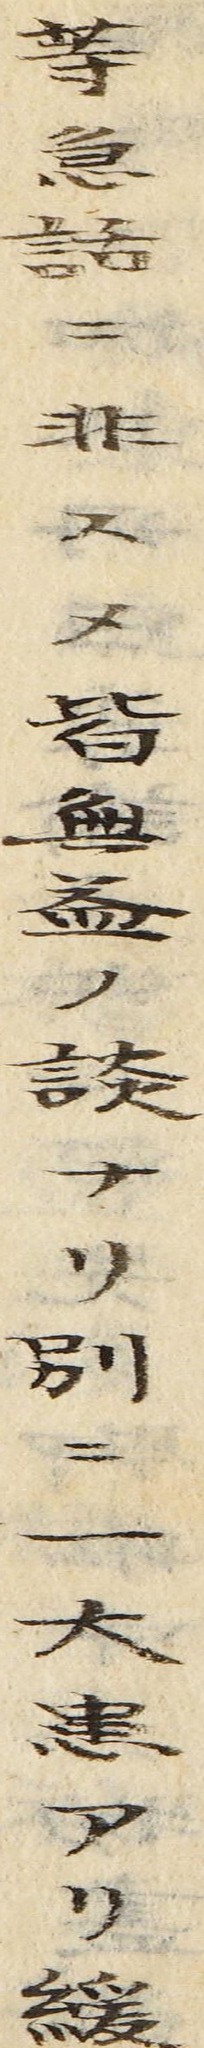等急話ニ非スシテ皆無益ノ談ナリ別ニ一大患アリ緩
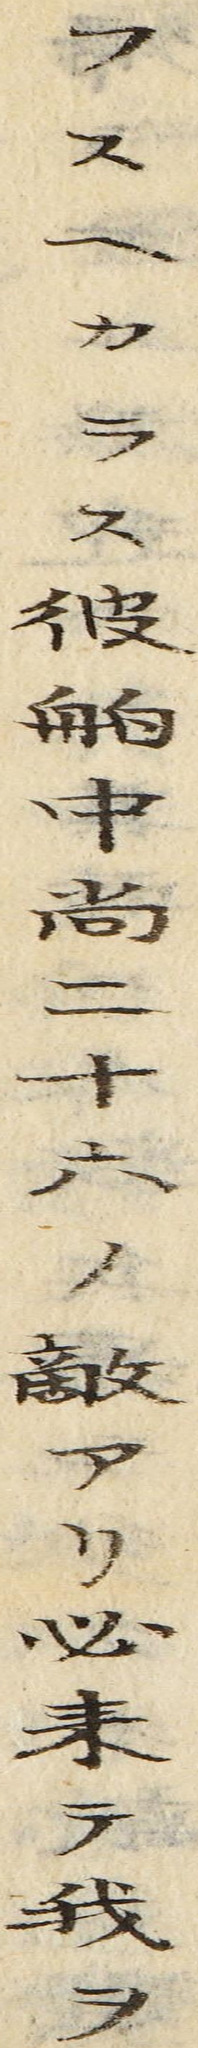フスヘカラス彼舶中尚二十六ノ敵アリ必来テ我ヲ
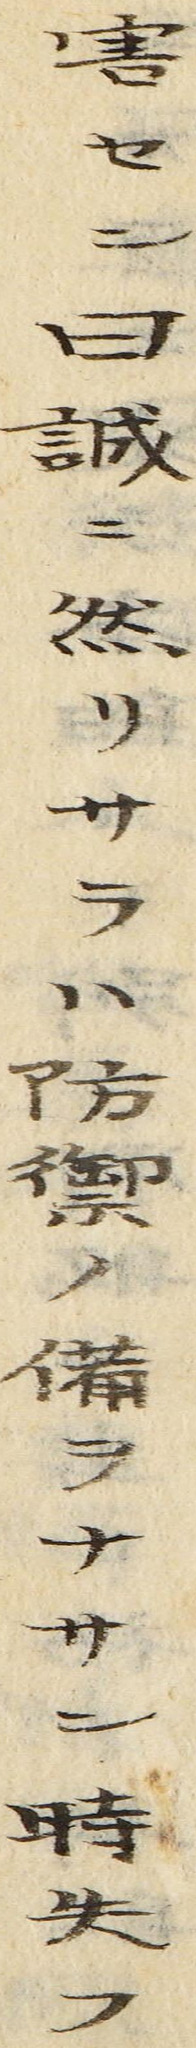害セン曰誠ニ然リサラハ防禦ノ備ヲナサン時失フ

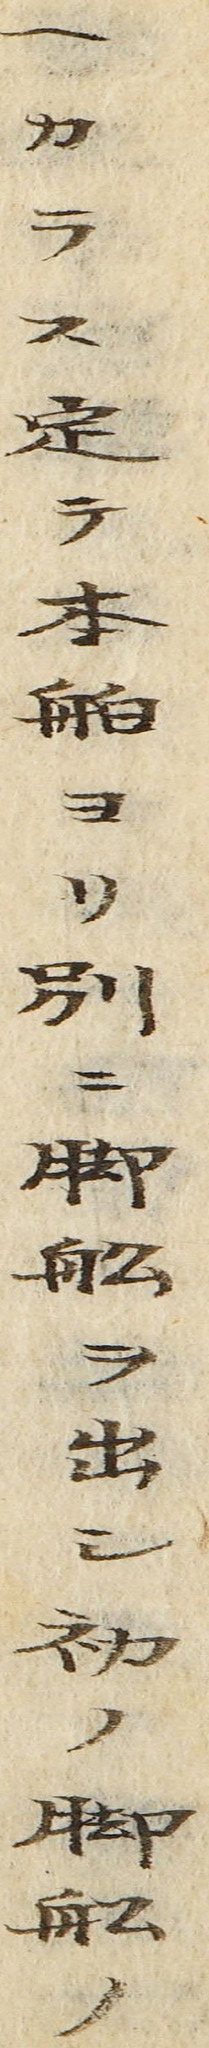ヘカラス定テ本舶ヨリ別ニ脚船ヲ出シ初ノ脚船ノ
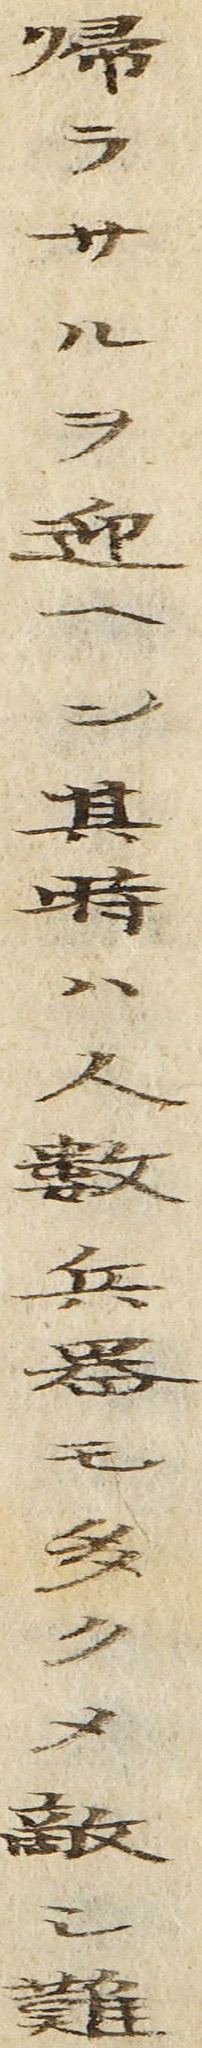帰ラサルヲ迎ヘン其時ハ人数兵器モ多クシテ敵シ難
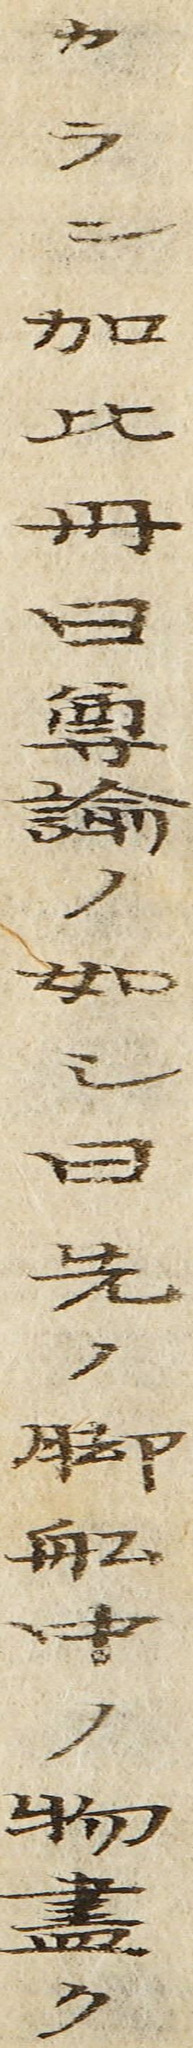カラン加比丹曰尊論ノ如シ曰先ノ脚船中ノ物尽ク
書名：漂流紀事
